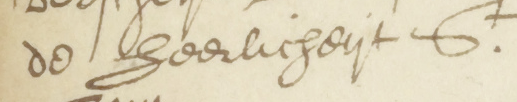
de heerlicheyt St.
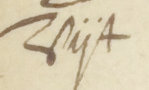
Vijt
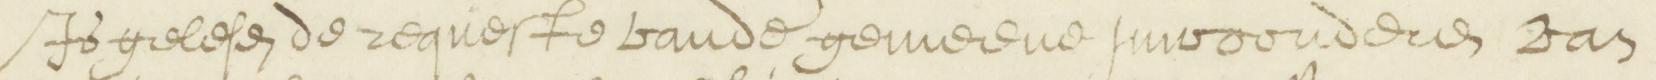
Is gelesen de requeste vande gemeene inwoonderen van
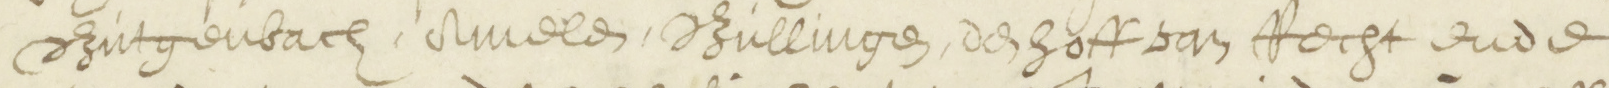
Butgenbach, Amelen, Bullingen, den hoff van Recht ende
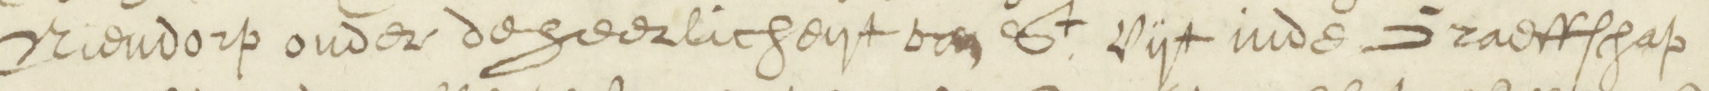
Nieudorp onder de heerlicheyt van St. Vijt inde Graeffschap
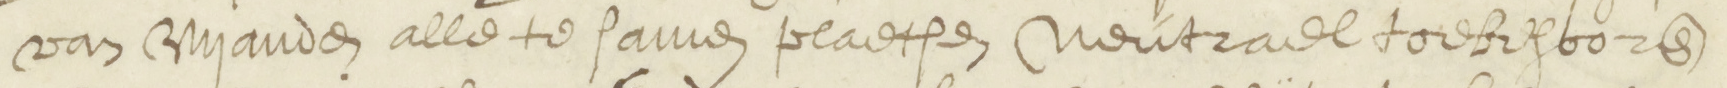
van Vyanden alle te samen plaetsen Neutrael toebehoor&
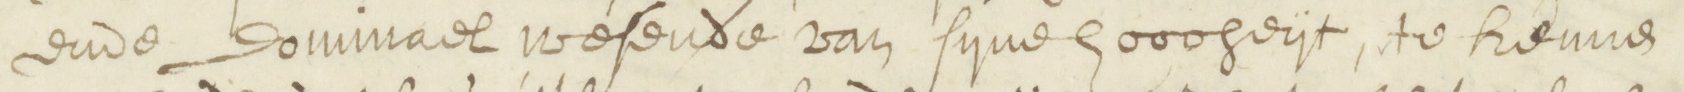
ende Dominael wesende van syne hoocheijt, te kennen
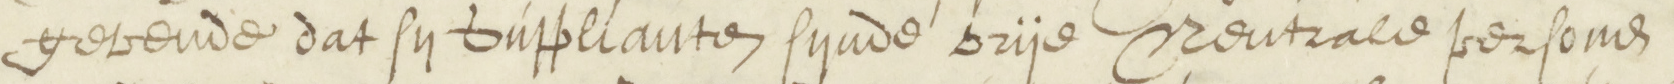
gevende dat sy Supplianten synde vrije Neutrale personen
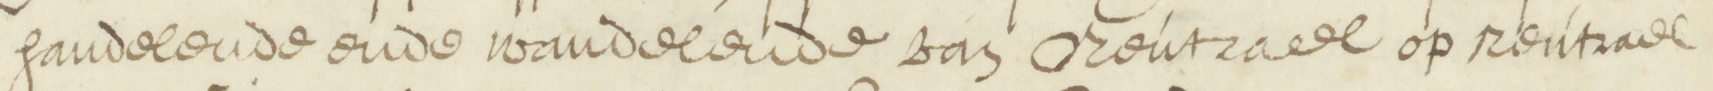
handelende ende wandelende van Neutrael op neutrael
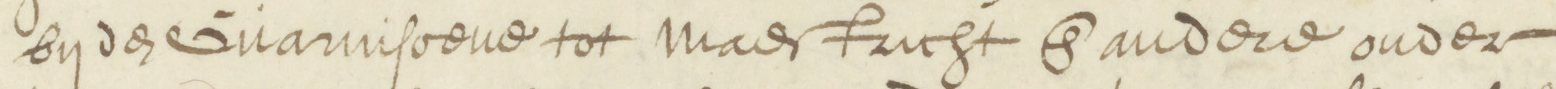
by den Guarnisoene tot Maestricht & andere onder
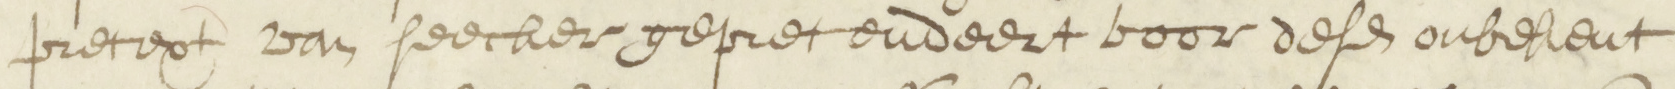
pretext van seecker gepretendeert voor desen onbekent
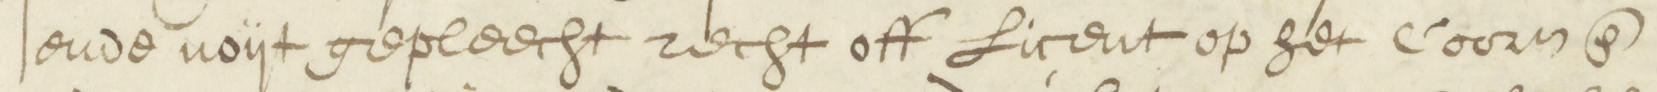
ende noijt gepleecht recht off Licent op het Coorn &
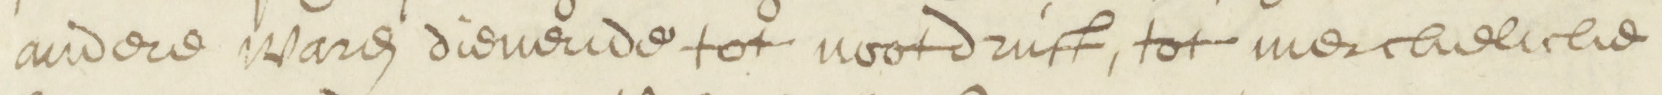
andere Waren dienende tot nootdruft, tot merckelicke
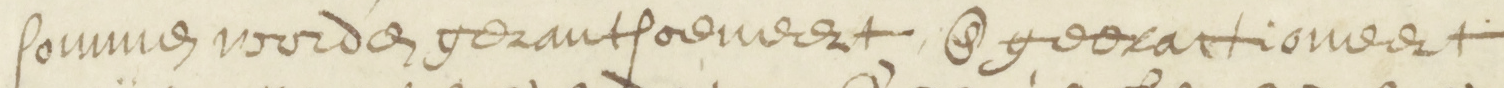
sommen worden gerantsoeneert, & geexactioneert
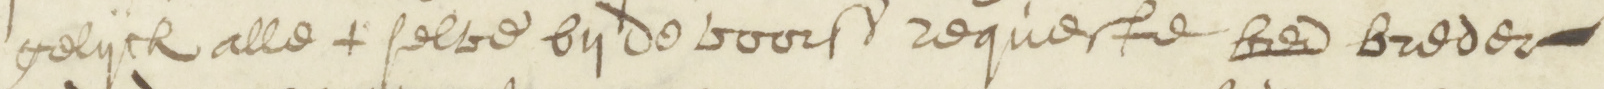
gelijck alle t‛selve by de voors requeste bed breder
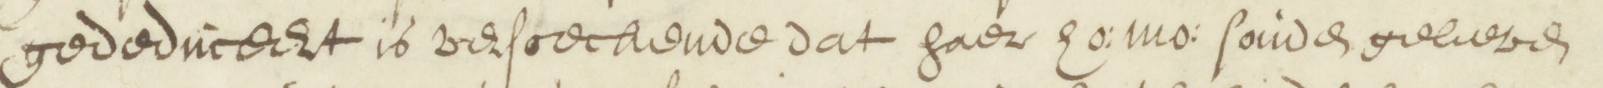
gededuceert is versoeckende dat haer ho:mo: souden gelieven
